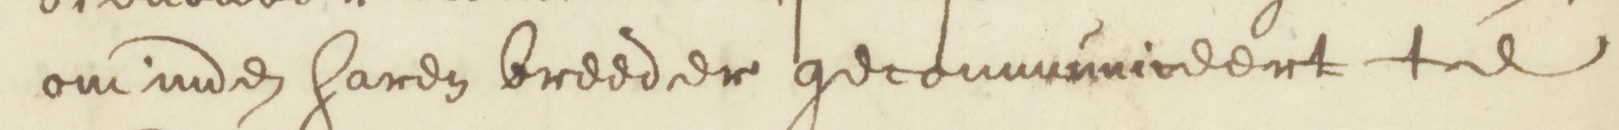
om inden haren breeder gecommuniceert te
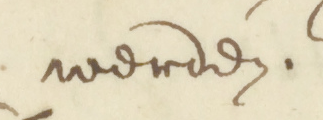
werden.
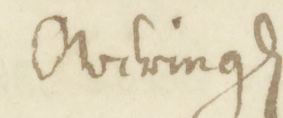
Overingh
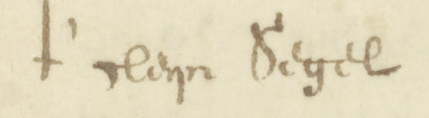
t'cleyn Segel
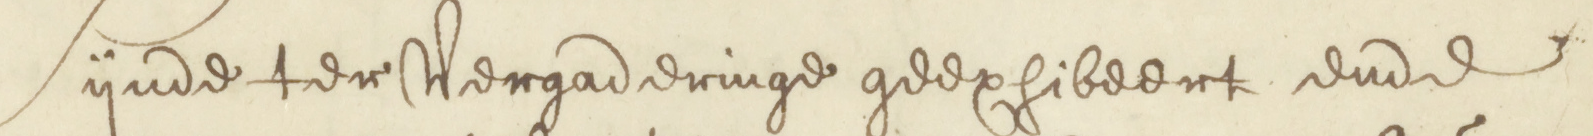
Sijnde ter Vergaderinge geexhibeert ende
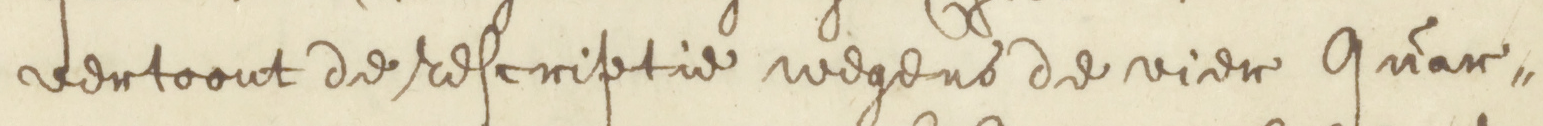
vertoont de rescriptie wegens de vier Quar,,
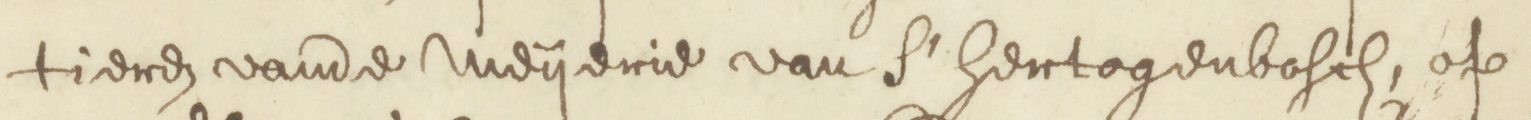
tieren vande meijerie van s'Hertogenbosch, op
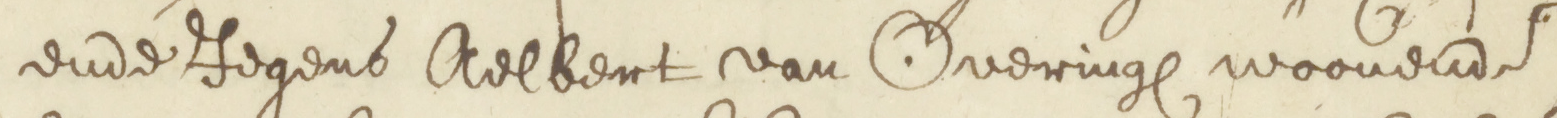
ende Jegens Aelbert van Overingh, woonende
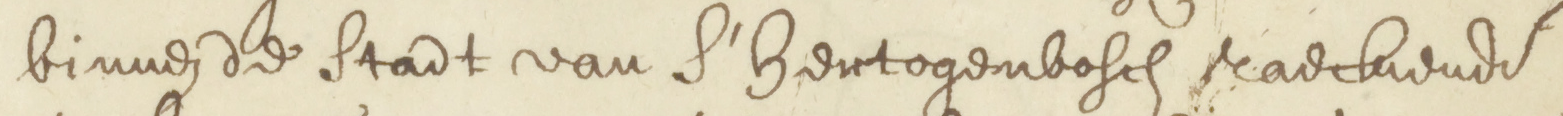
binnen de Stadt van s'Hertogenbosch raeckende
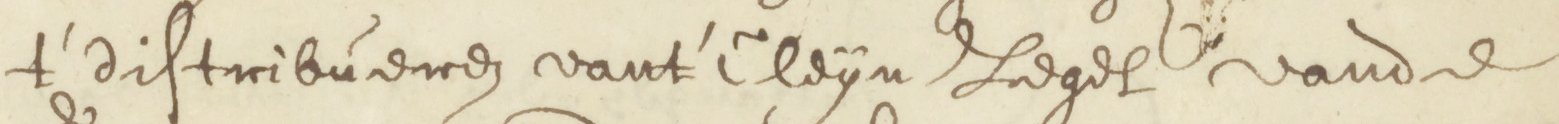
t‛distribueren vant' Cleijn, Zegel vande
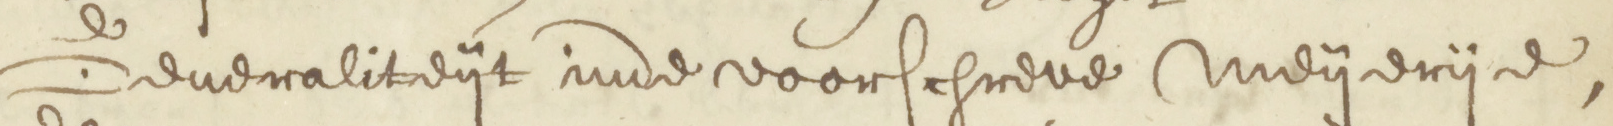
Generaliteijt inde voorschreve meijerije.
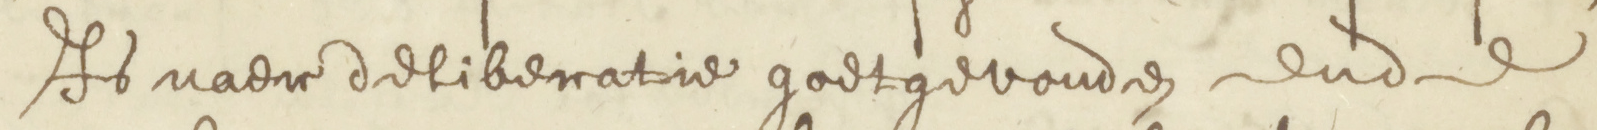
Is naer deliberatie goetgevonden ende
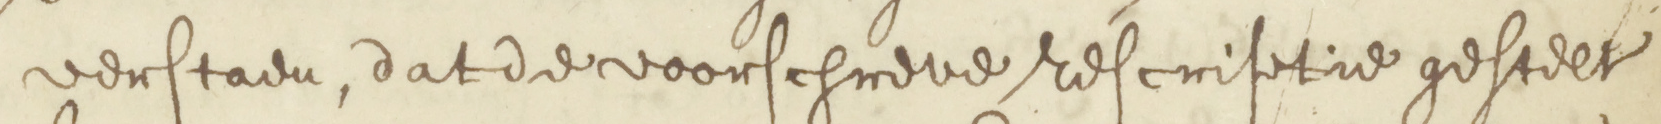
verstaen, dat de voorschreve rescriptie gestelt
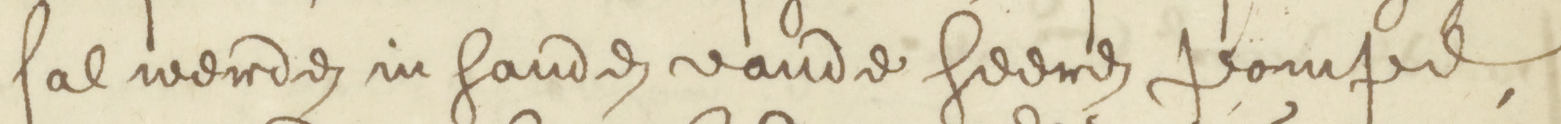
sal werden in handen vande heeren Pompe,
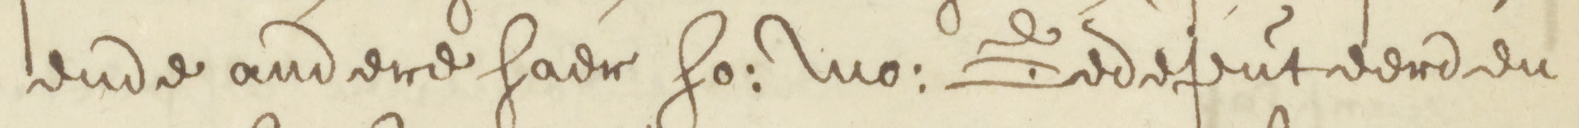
ende andere haer Ho:Mo: Gedeputeerden
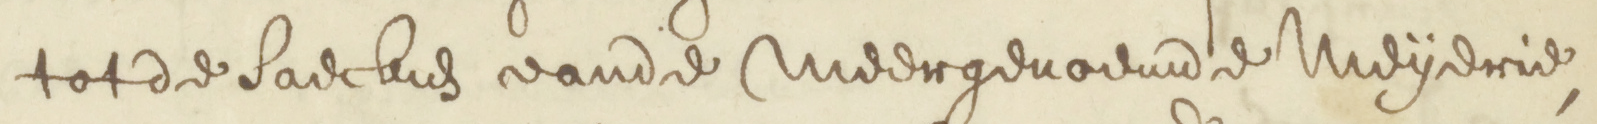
tot de saecken vande meergenoemde Meijerie,
